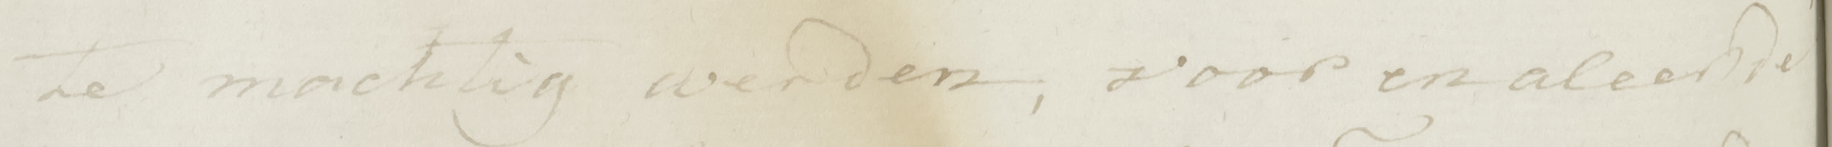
te machtig werden, voor en aleer de
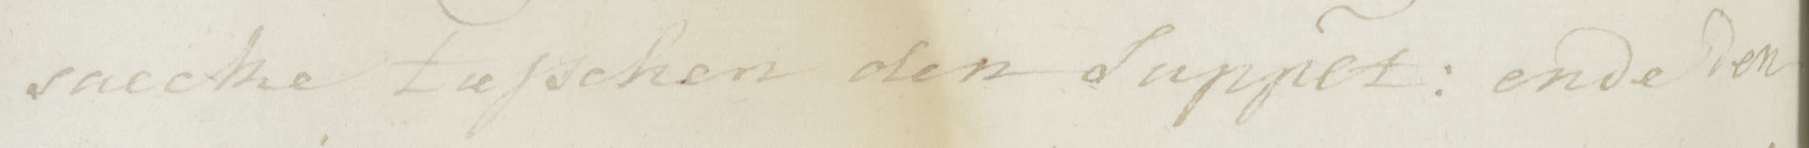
saecke tusschen den Supplt: ende den
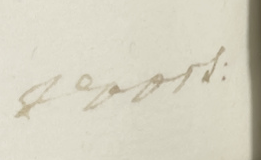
voors:
